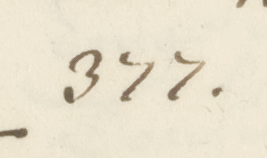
377.
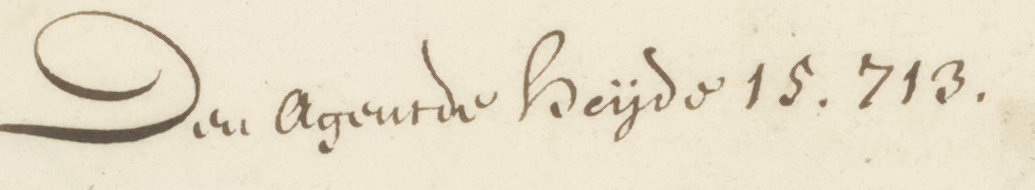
Den Agent de Heijde 15. 173.
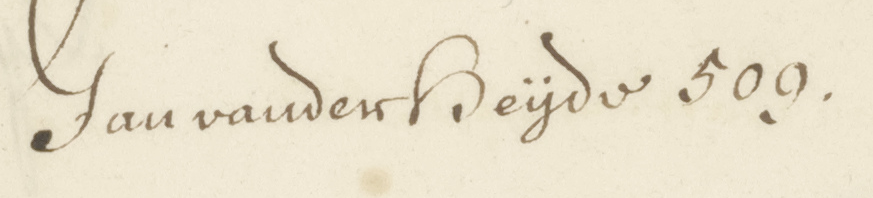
Jan van der Heijde 509.
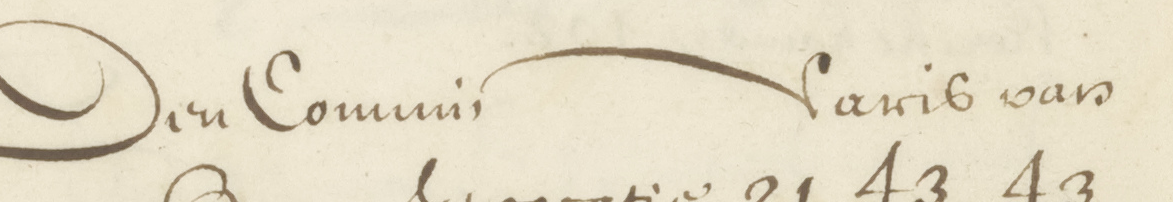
Den Commissaris van
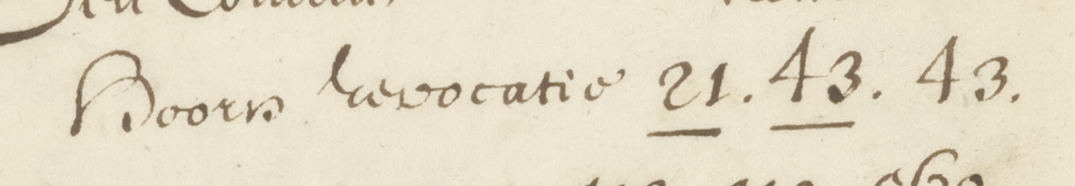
Hoorn Revoctie 21. 43. 43.
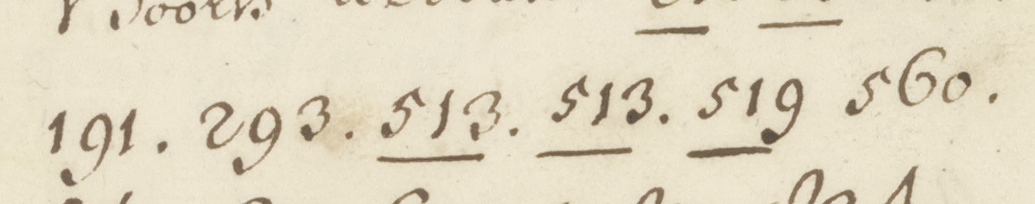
191. 293. 513. 513. 519. 560.
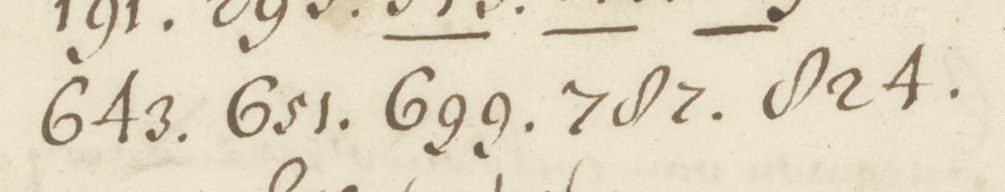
643. 651. 699. 787. 824.
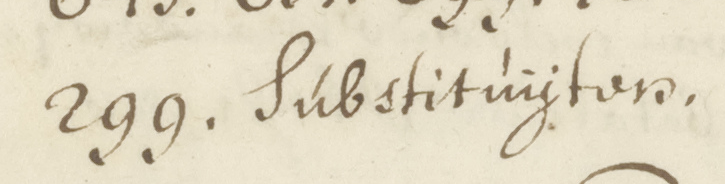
299. Substituijten.
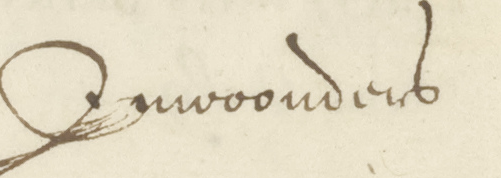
Inwoonders
